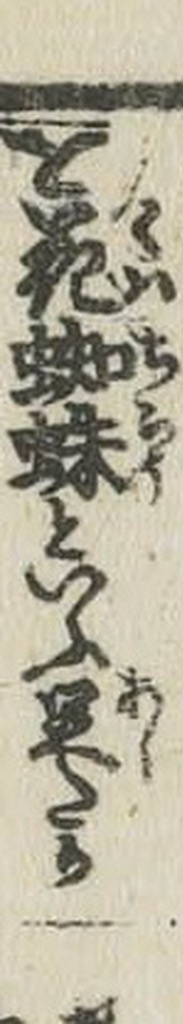を花蜘蛛といふ足たか
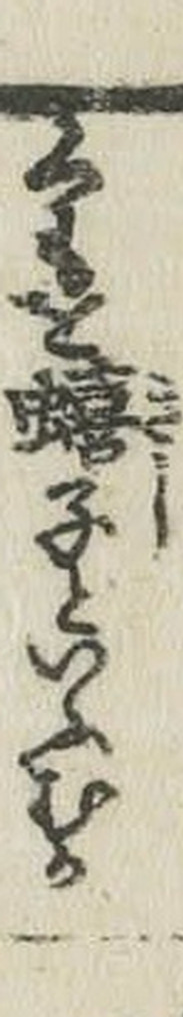くもを蟢子といふむか
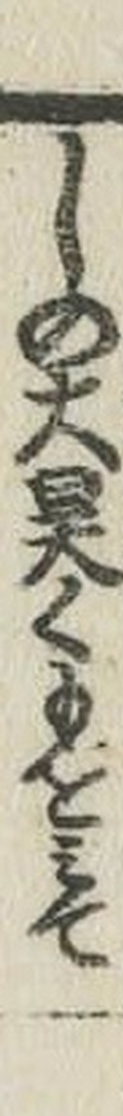しの大昊くもをみて
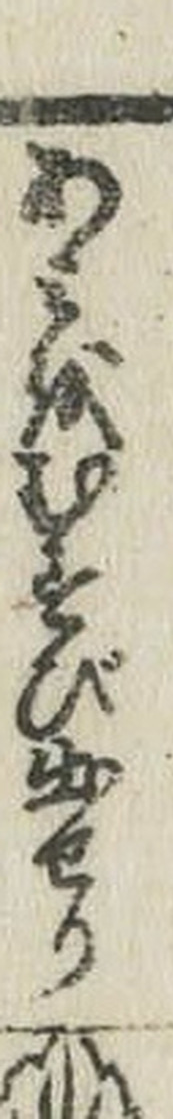あみをむすび出せり
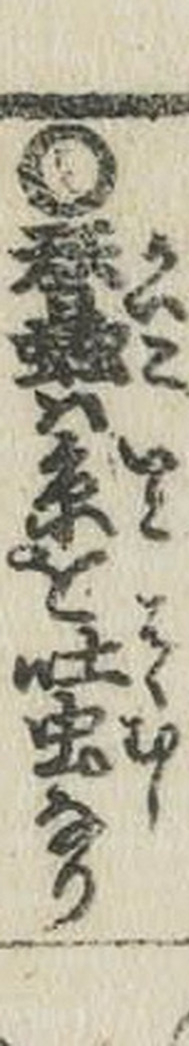○蚕は糸を吐虫なり
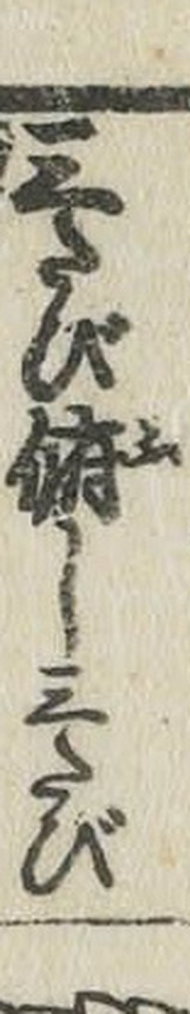三たび俯し三たび
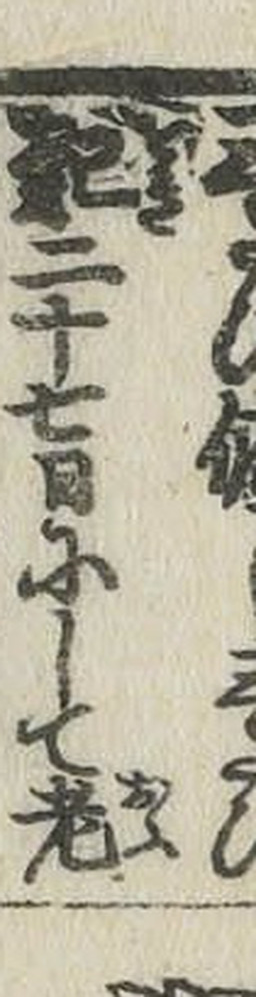起二十七日にして老
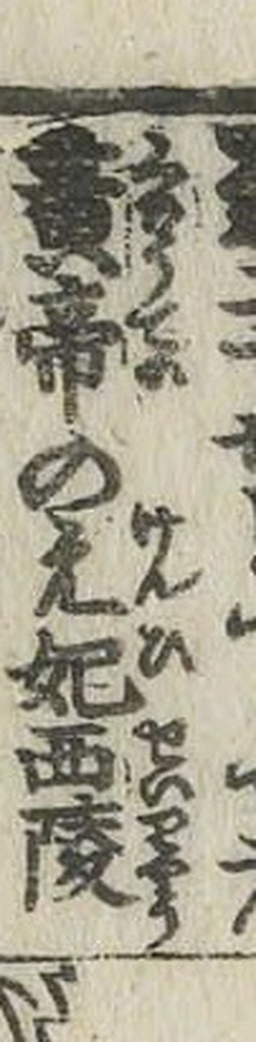黄帝の元妃西陵
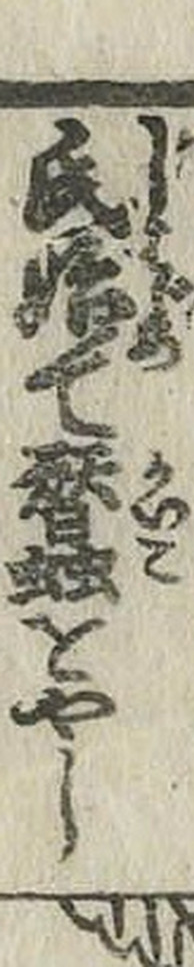氏始て蚕をやし
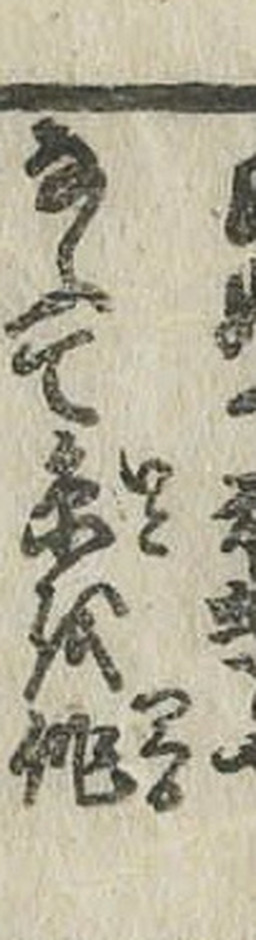なふて糸を作
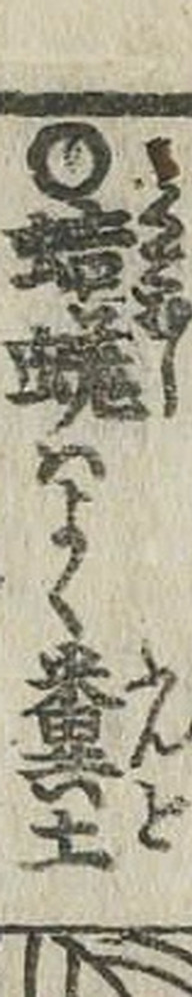○蛣蜣はよく糞土
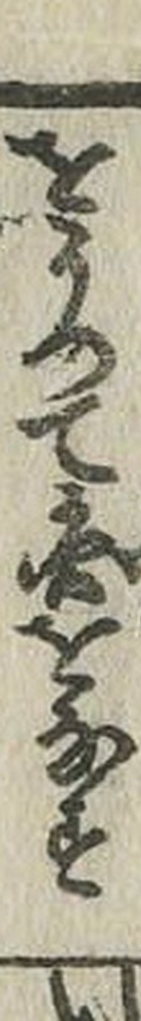をうつて円をなす

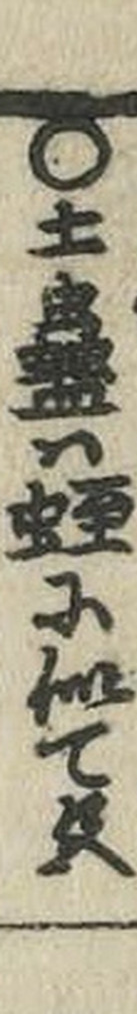○土蠱は蛭に似て色
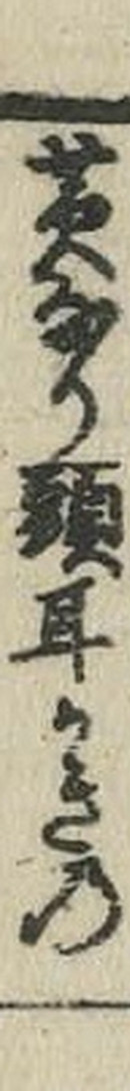黄なり頭耳かきの
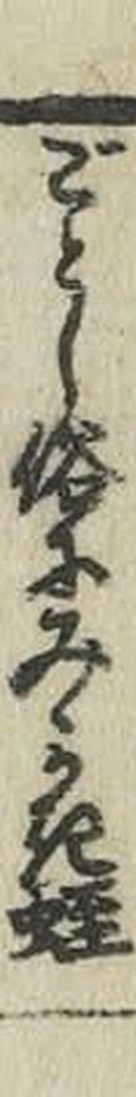ごとし俗にみゝかき蛭
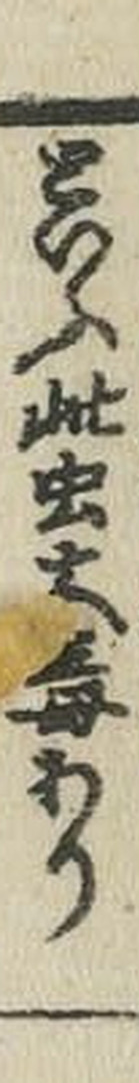といふ此虫大毒あり
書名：増補頭書訓蒙図彙大成 10巻 7:巻之14-16
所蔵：東京学芸大学教育コンテンツアーカイブ
